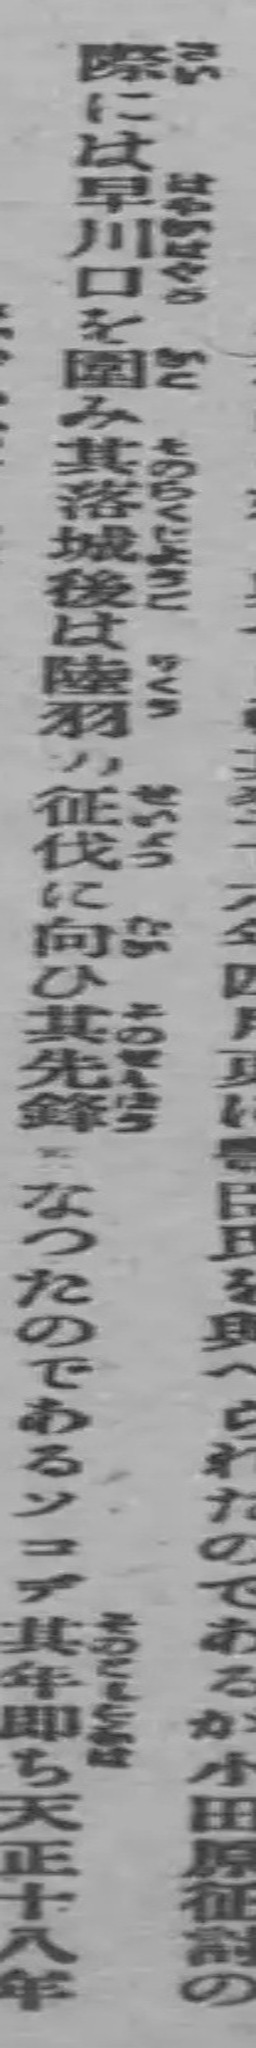際には早川口を囲み其落城後は陸羽の征伐に向ひ其先鋒となつたのであるソコデ其年即ち天正十八年
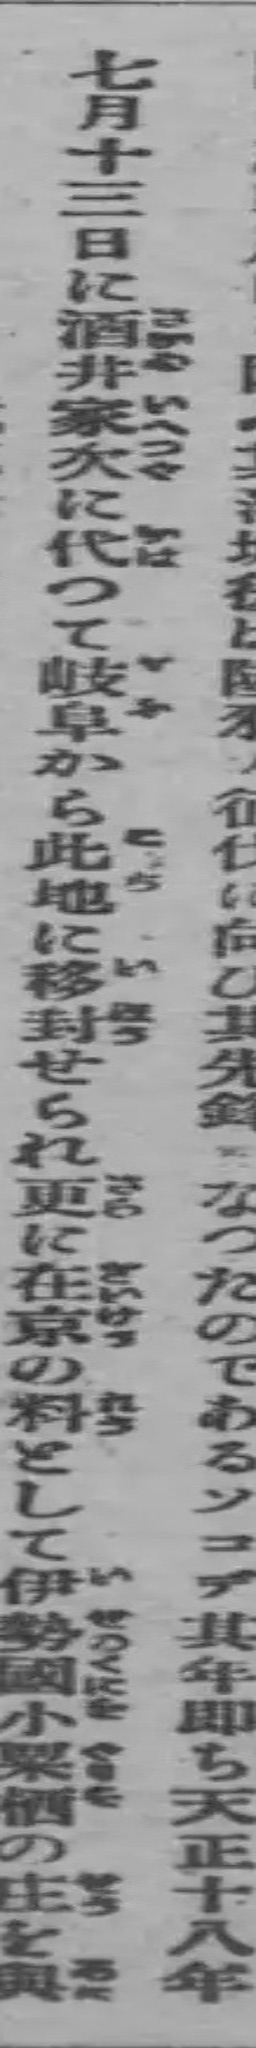七月十三日に酒井家次に代つて岐阜から此地に移封せられ更に在京の料として伊勢国小栗栖の庄を与
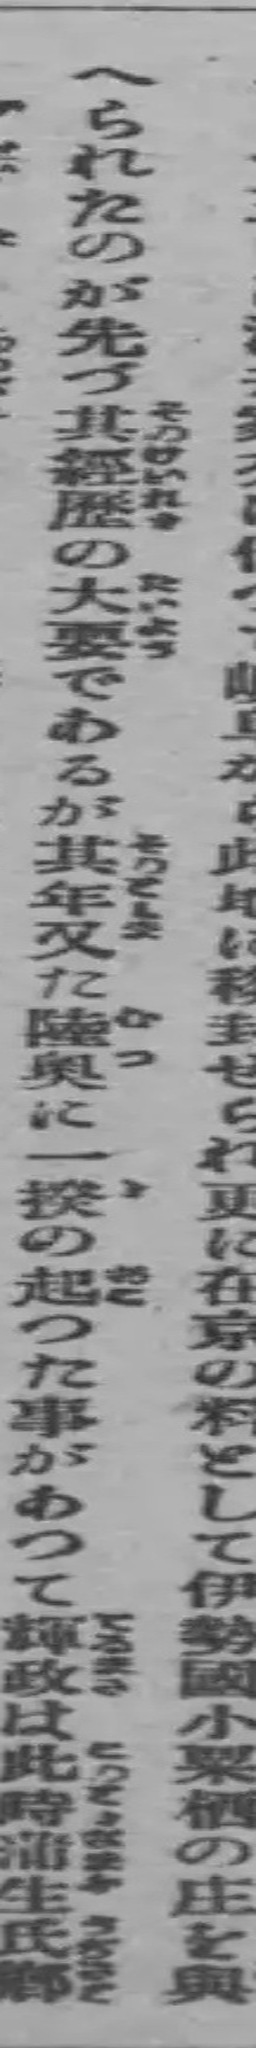へられたのが先づ其経歴の大要であるが其年又た陸奥に一揆の起つた事があつて輝政は此時蒲生氏郷
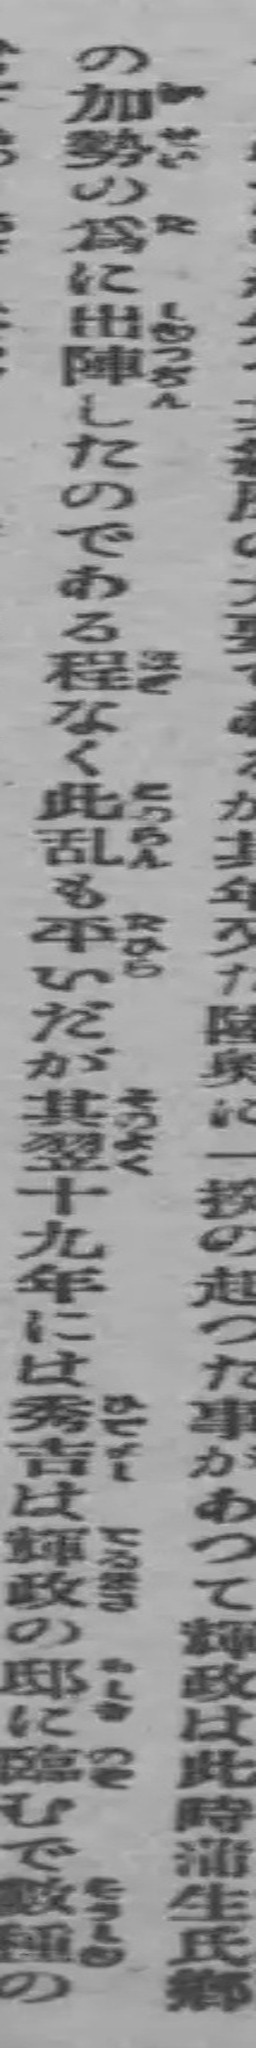の加勢の為に出陣したのである程なく此乱も平いだが其翌十九年には秀吉は輝政の邸に臨むで数種の
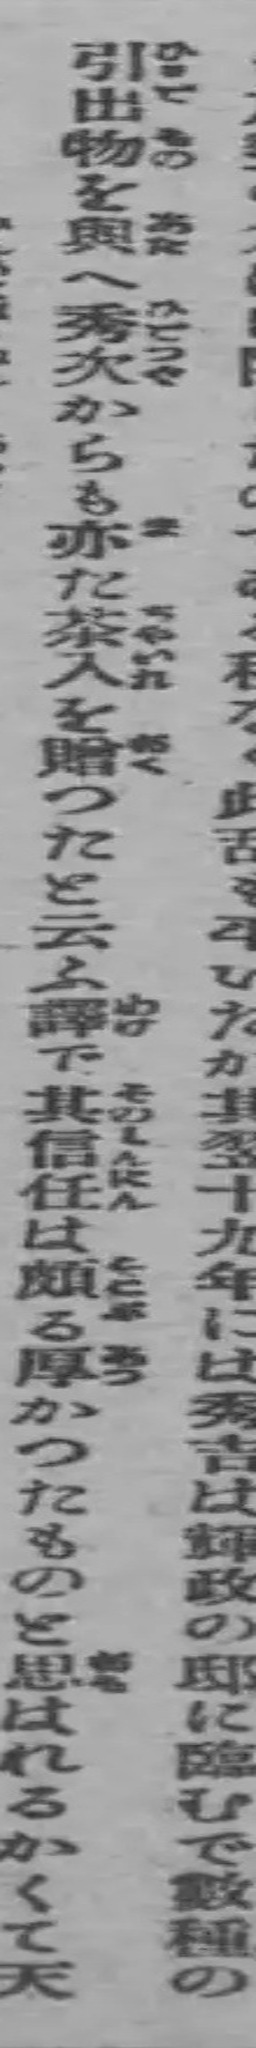引出物を与へ秀次からも亦た茶入を贈つたと云ふ訳で其信任は頗る厚かつたものと思はれるかくて天
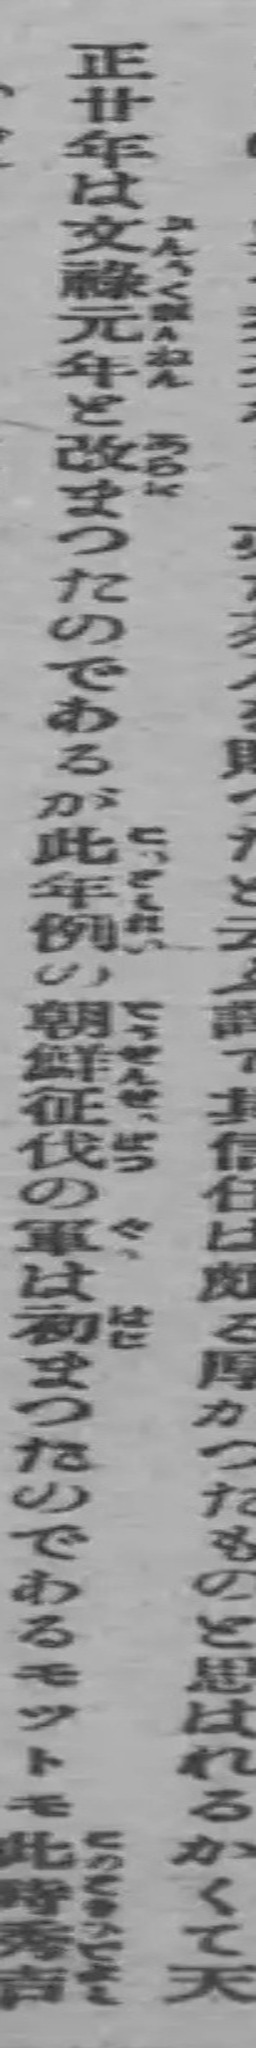文禄の役正廿年は文禄元年と改まつたのであるが此年例の朝鮮征伐の軍は初まつたのであるモツトモ此時秀吉
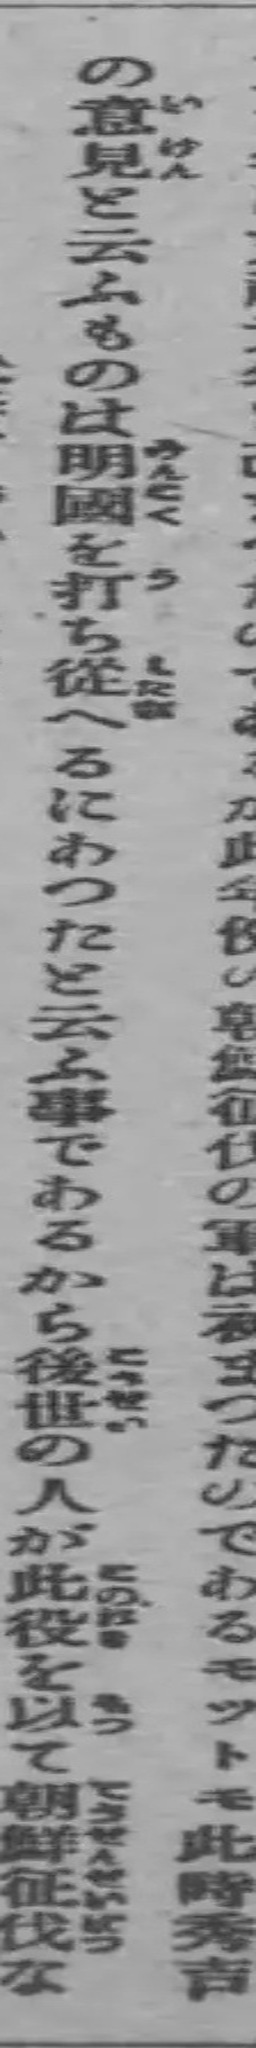の意見と云ふものは明国を打ち従へるにあつたと云ふ事であるから後世の人が此役を以て朝鮮征伐な
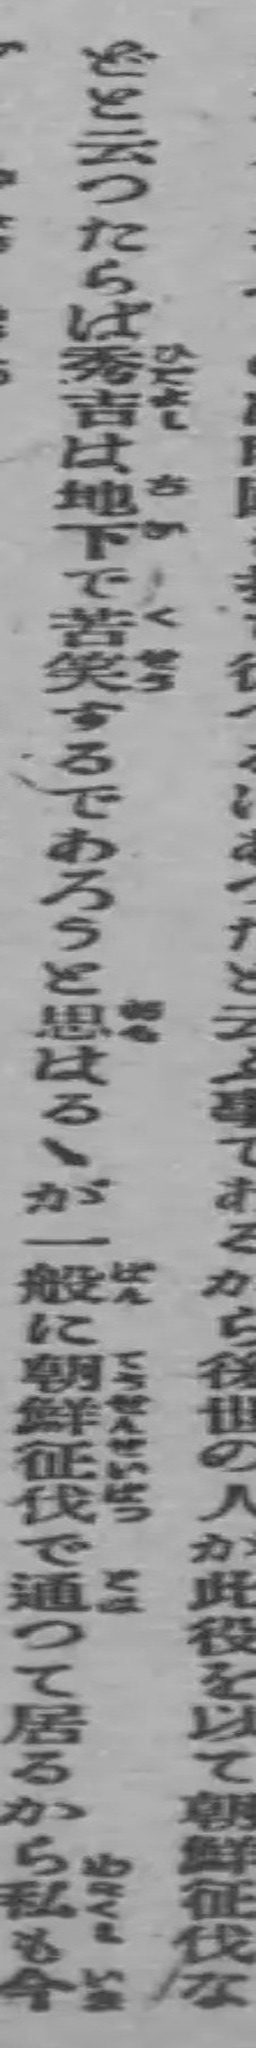どと云つたらば秀吉は地下で苦笑するであろうと思はるゝが一般に朝鮮征伐で通つて居るから私も今
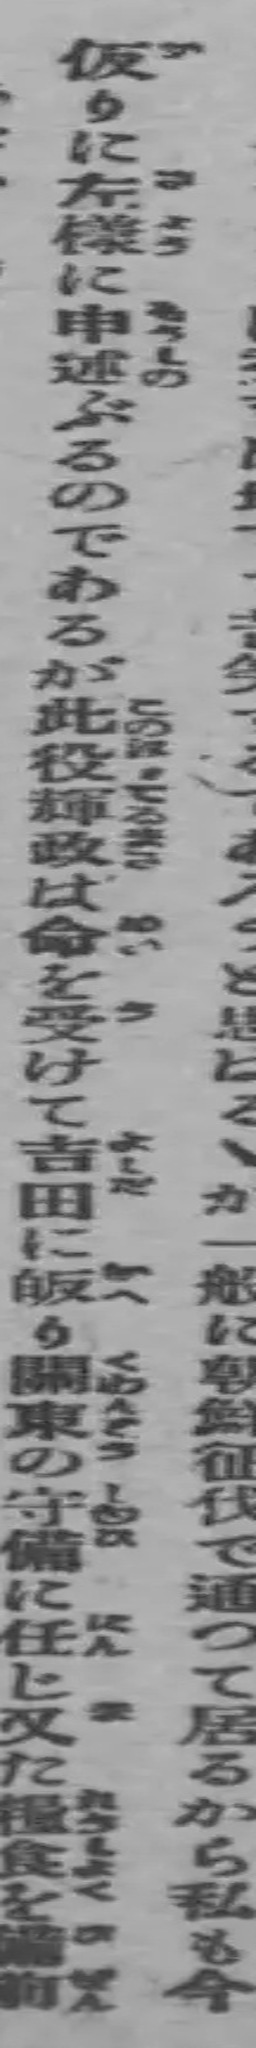仮りに左様に申述ぶるのであるが此役輝政は命を受けて吉田に皈り関東の守備に任じ又た糧食を備前
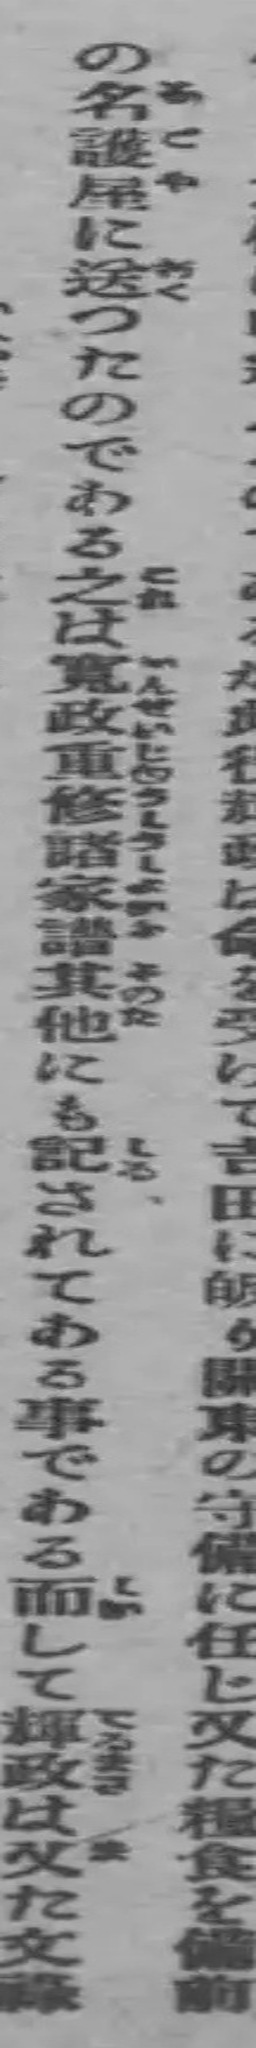の名護屋に送つたのである之は寛政重修諸家譜其他にも記されてある事である而して輝政は又た文禄
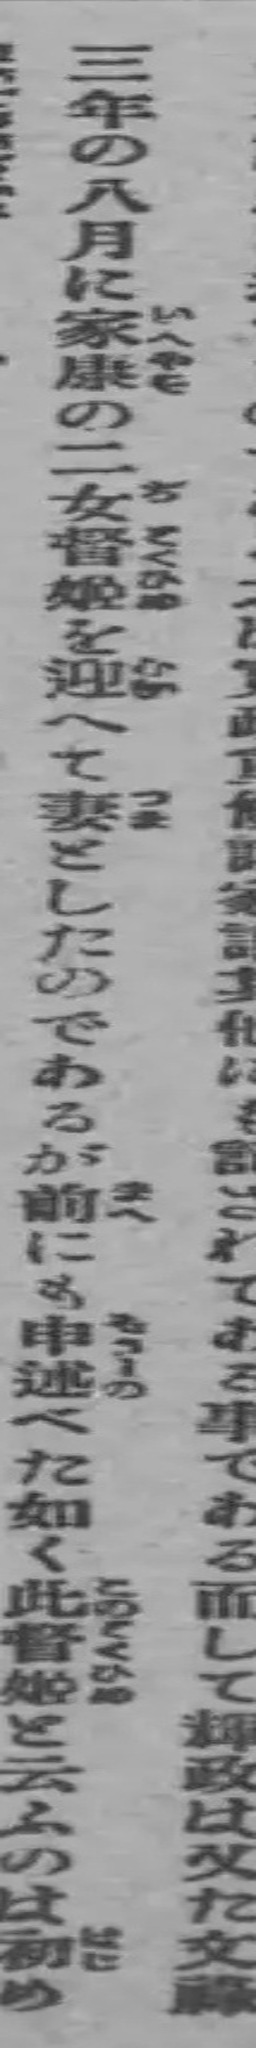三年の八月に家康の二女督姫を迎へて妻としたのであるが前にも申述べた如く此督姫と云ふのは初め
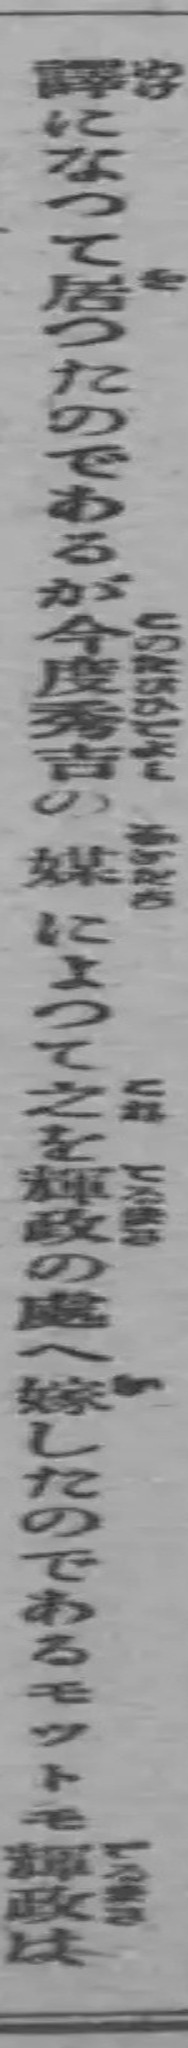訳になつて居つたのであるが今度秀吉の謀によつて之を輝政のところへ嫁したのであるモツトモ輝政は
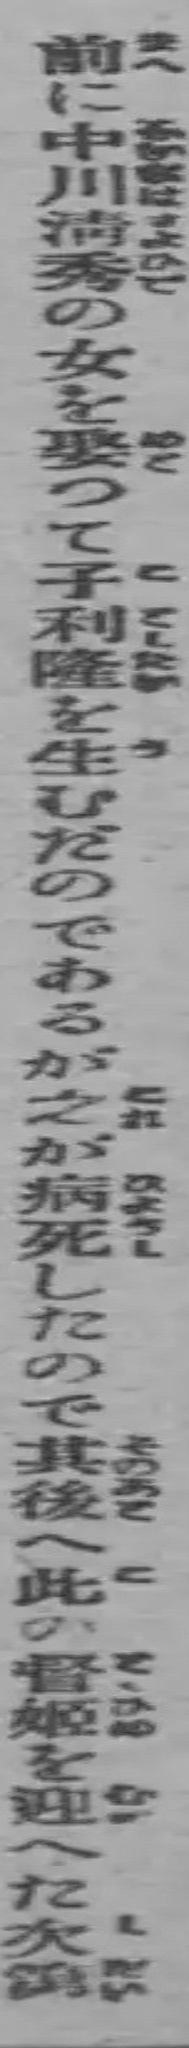前に中川清秀の女を娶つて子利隆を生むだのであるが之が病死したので其後へ此の督姫を迎へた次第
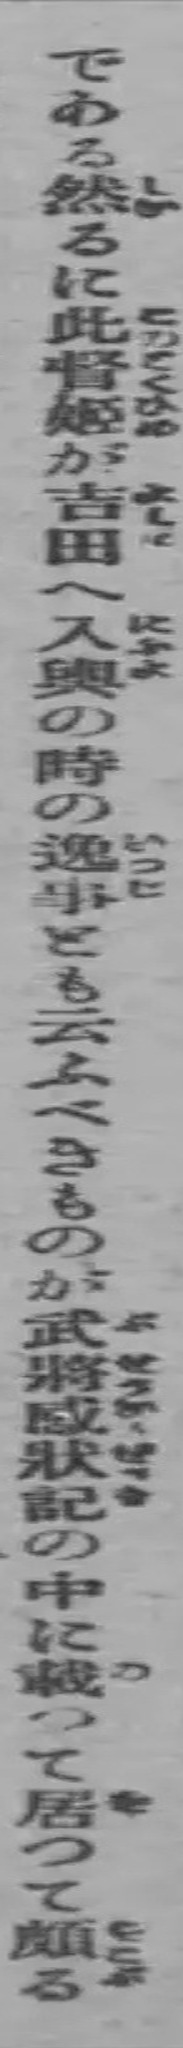である然るに此督姫が吉田へ入輿の時の逸事とも云ふべきものが武将感状記の中に載つて居つて頗る
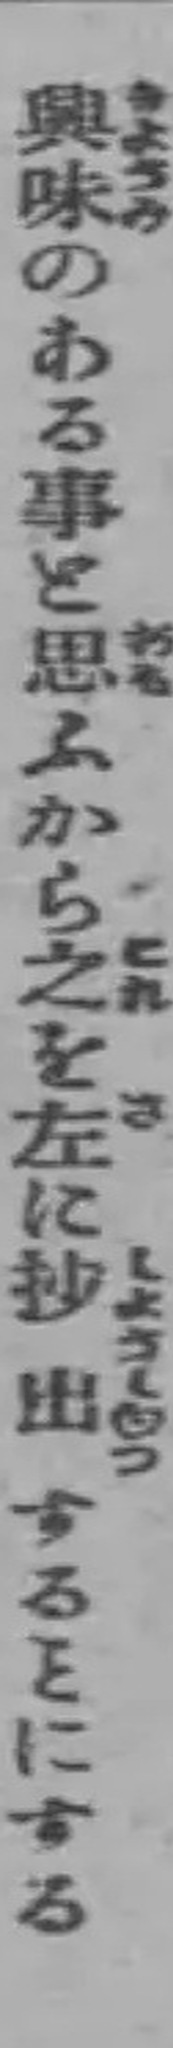興味のある事と思ふから之を左に抄出することにする
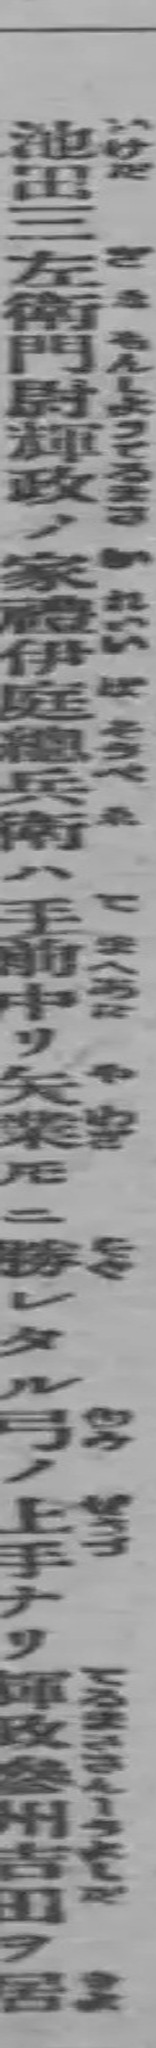池田三左衛門尉輝政ノ家礼伊庭総兵衛ハ手前中リ矢業モノニ勝レタル弓ノ上手ナリ輝政参州吉田ヲ居
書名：豊橋市史談
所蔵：国立国会図書館 National Diet Library, JAPAN
